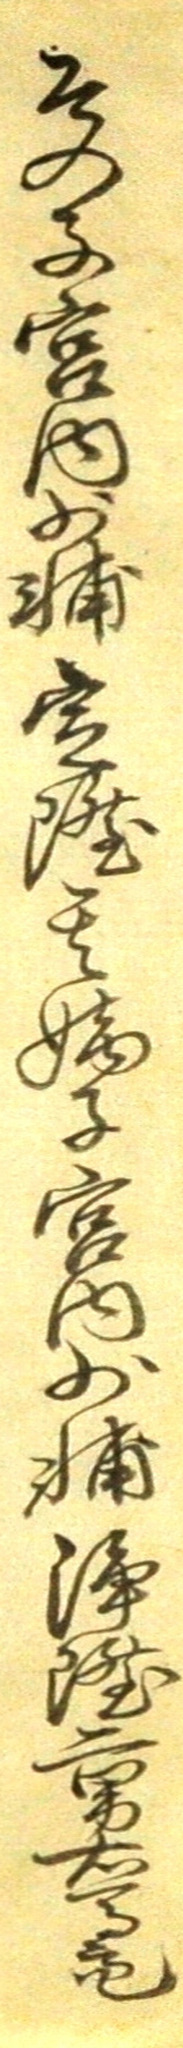その子宮内少輔定隆其嫡子宮内少輔浄隆二男右馬亮
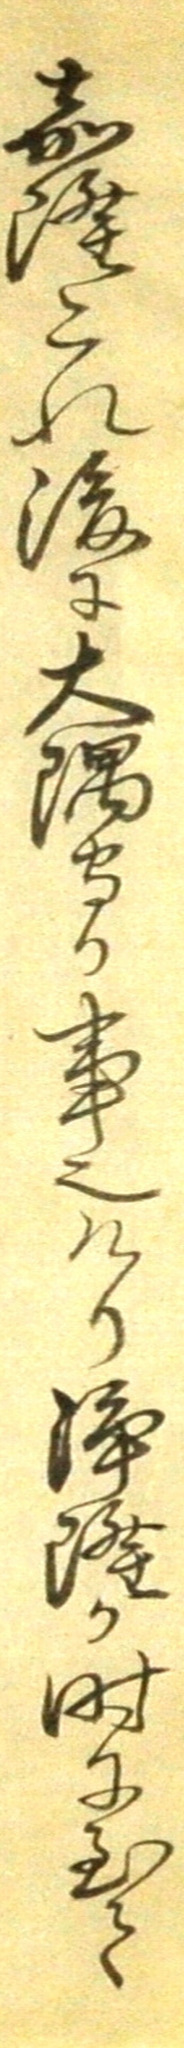嘉隆これ後に大隅守か事也けり浄隆か時に至て
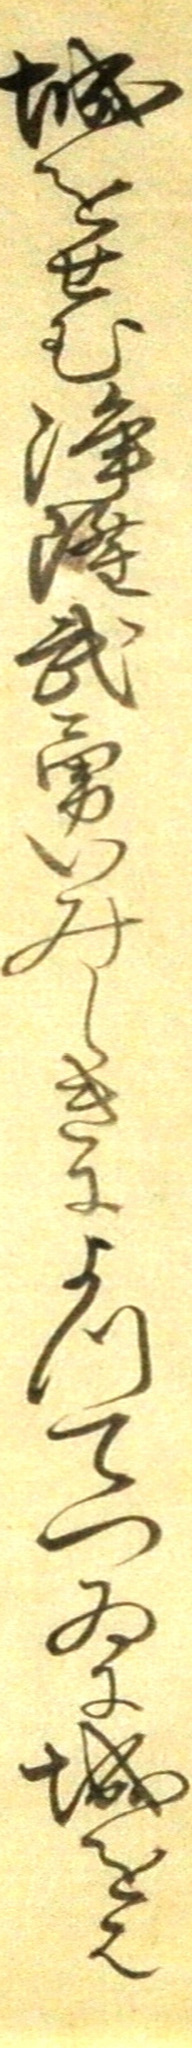城をせむ浄隆武勇いみしきによつてつゐに城をは
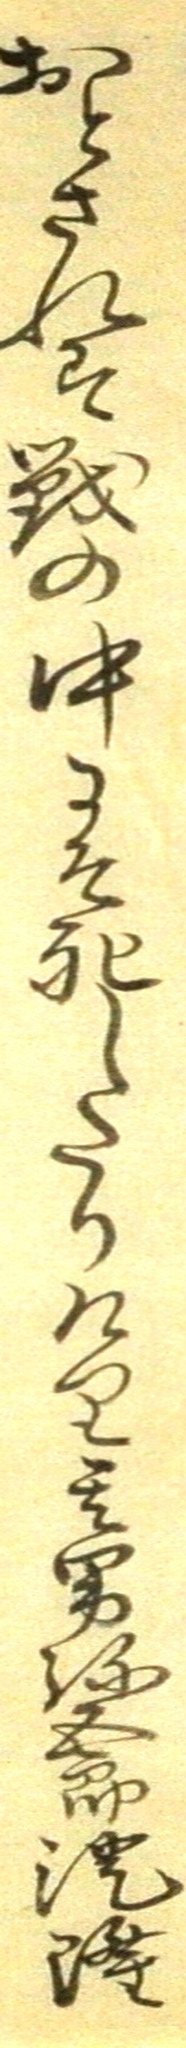おとされす戦の中にそ死したりけり其男弥五郎澄隆
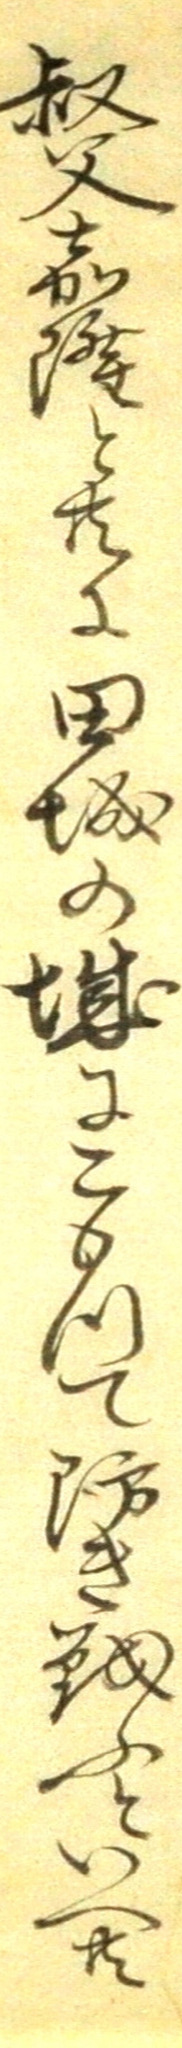叔父嘉隆と共に田城の城にこもつて防き戦ふといへ共
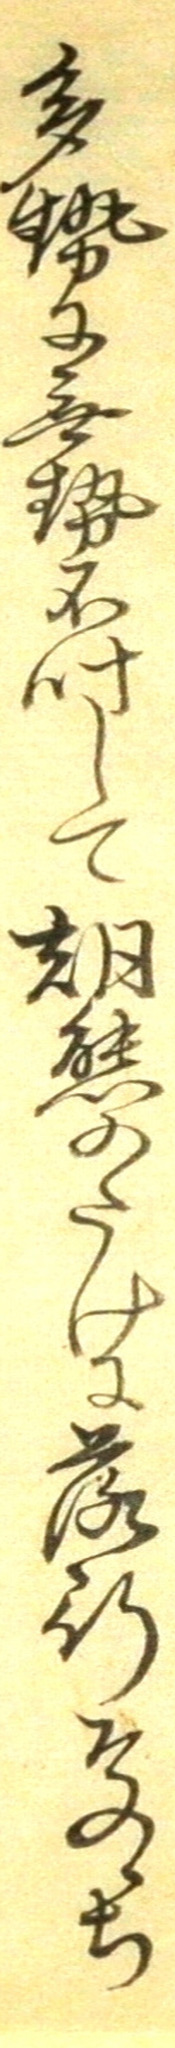多勢に無勢不叶して朝熊のたけに落行そのゝち
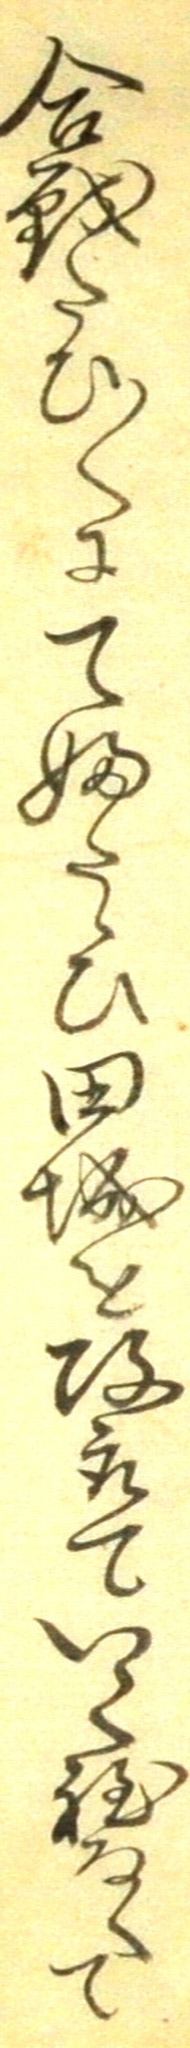合戦たひ〳〵にてふたゝひ田城を攻取ていく程なくて
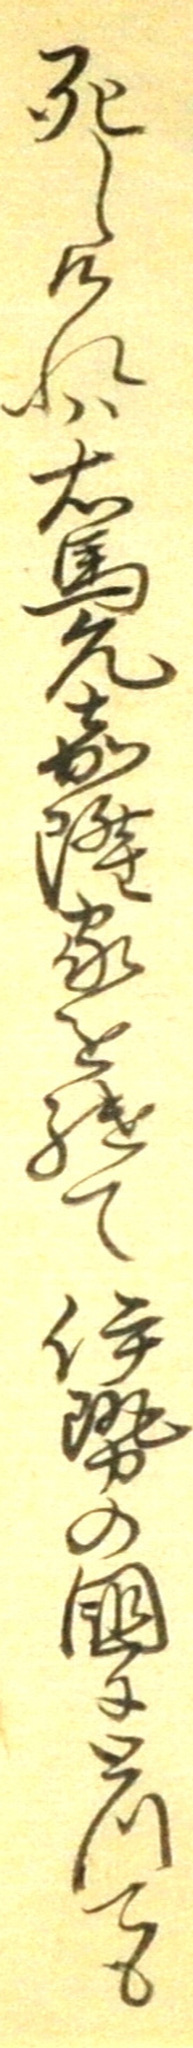死しけれは右馬允嘉隆家を継て伊勢の国にとつても
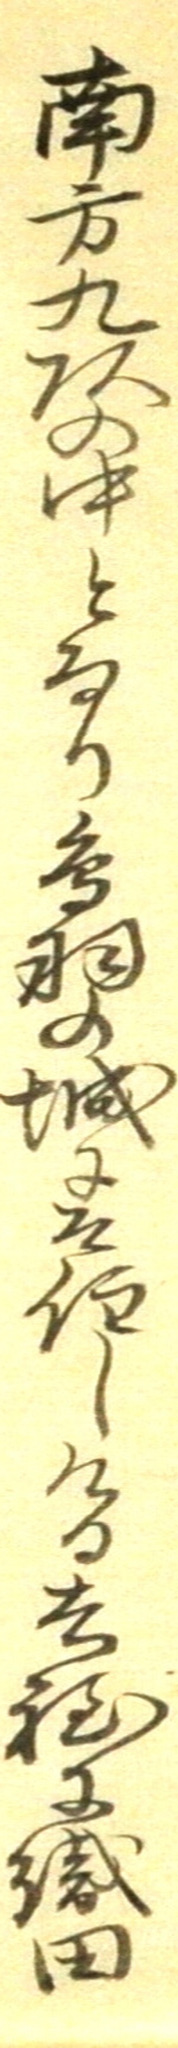南方九頭の中となり鳥羽の城にそ住しける去程に織田
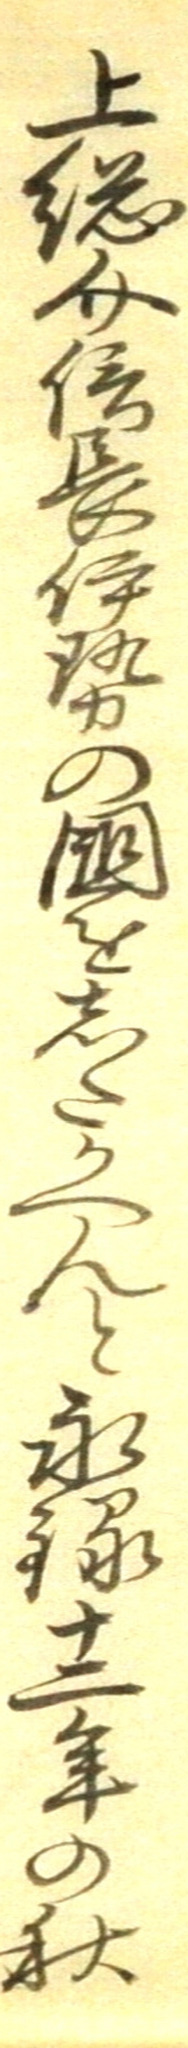上総介信長伊勢の国をしたかへんと永禄十二年の秋
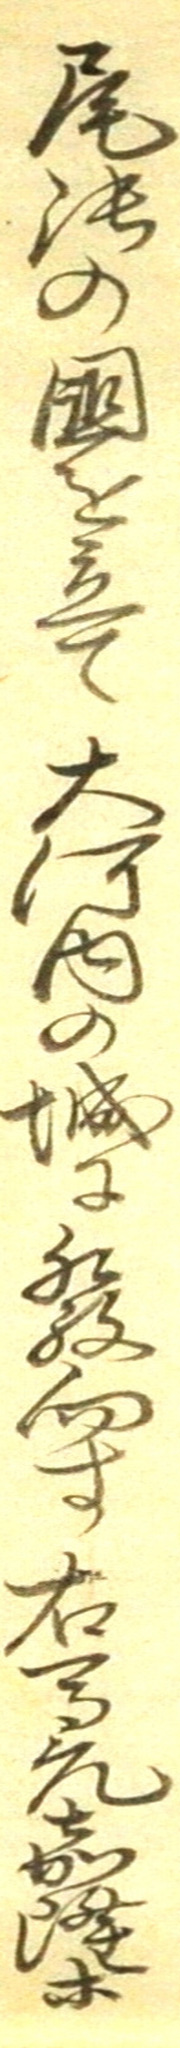尾張の国を立て大河内の城に発向す右馬允嘉隆等
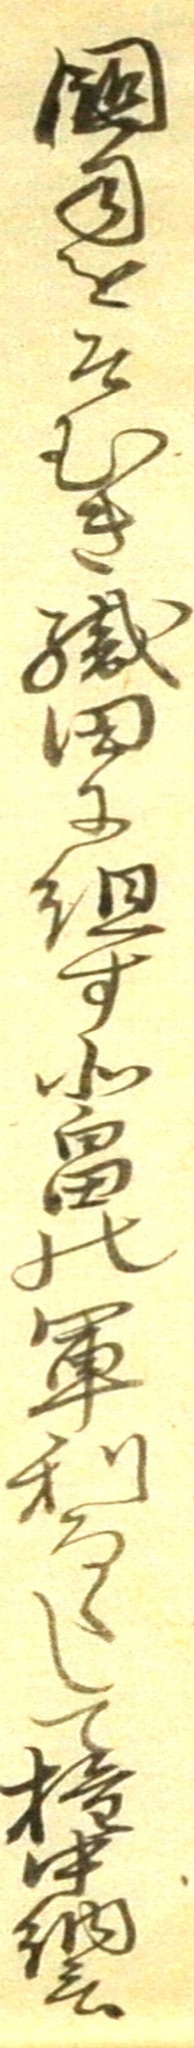国司をそむき織田に組す北畠の軍利なくして権中納言
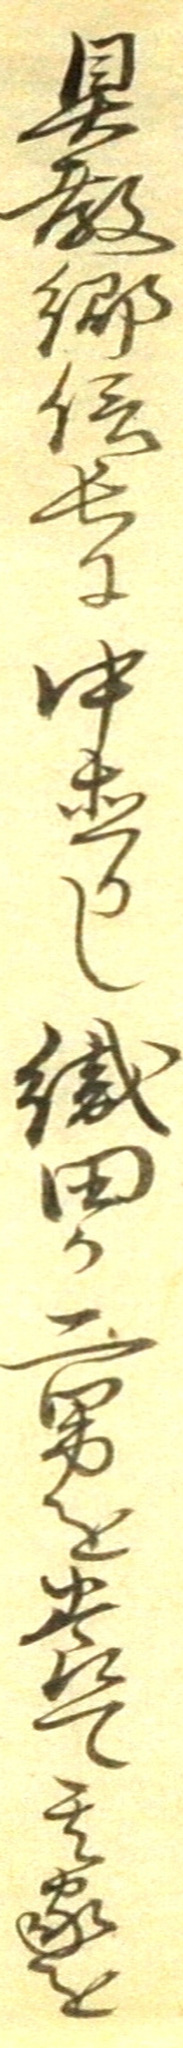具教卿信長に中直りし織田か二男を養て其家を
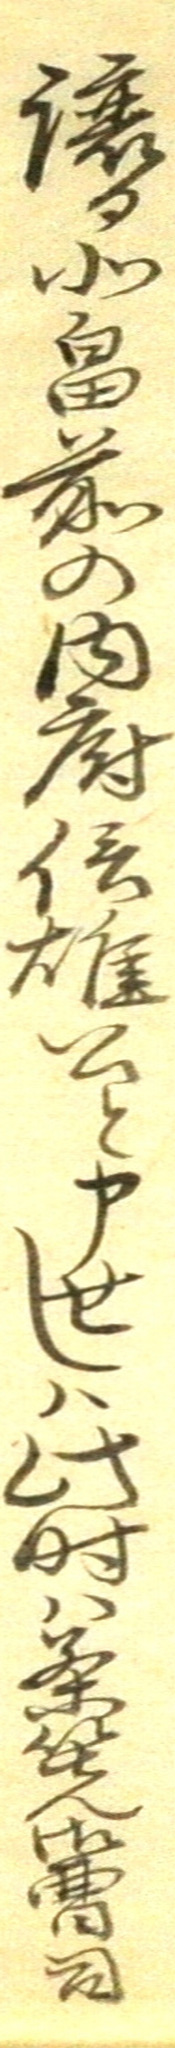譲る北畠前の内府信雄公と申せしは此時は茶筅御曹司
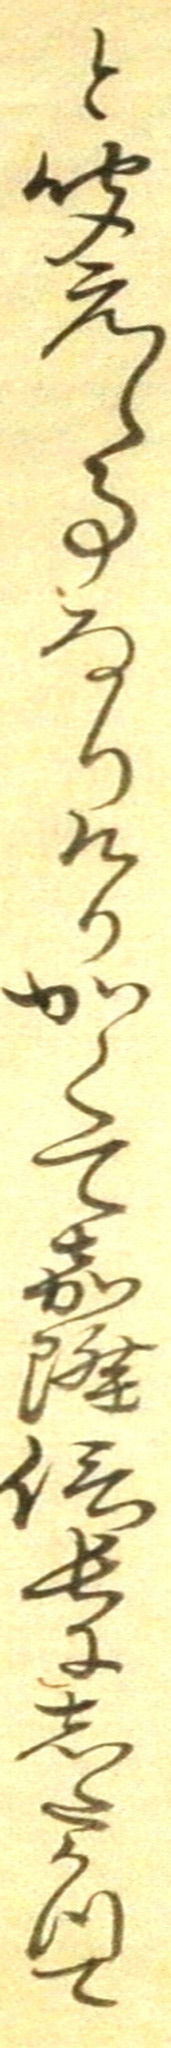と聞えし事なりけりかくて嘉隆信長にしたかつて
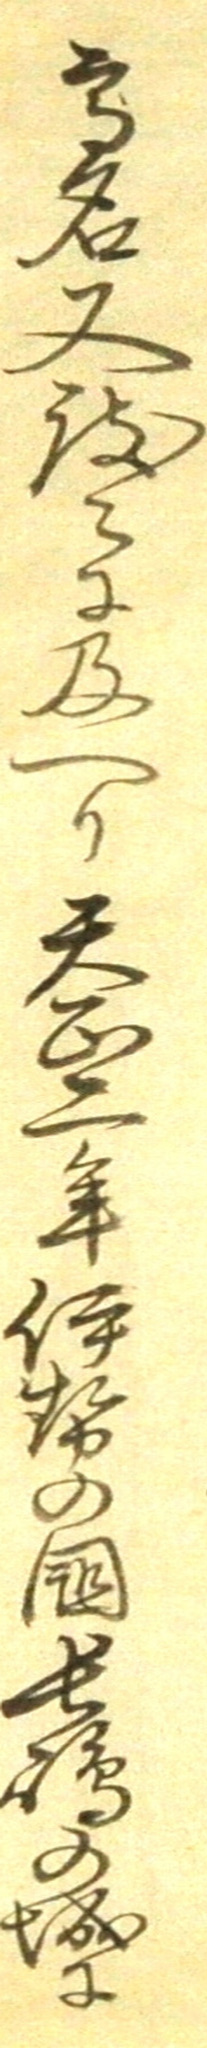高名又度々に及へり天正二年伊勢の国長島の城に
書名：藩翰譜（九・上）
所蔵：伊那市立高遠町図書館・合同会社AMANE
